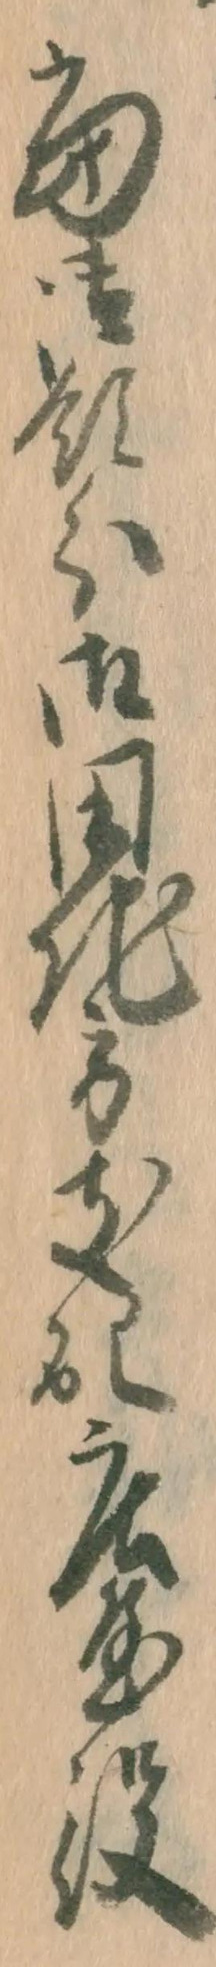一当御領分御田地方支配庄屋役

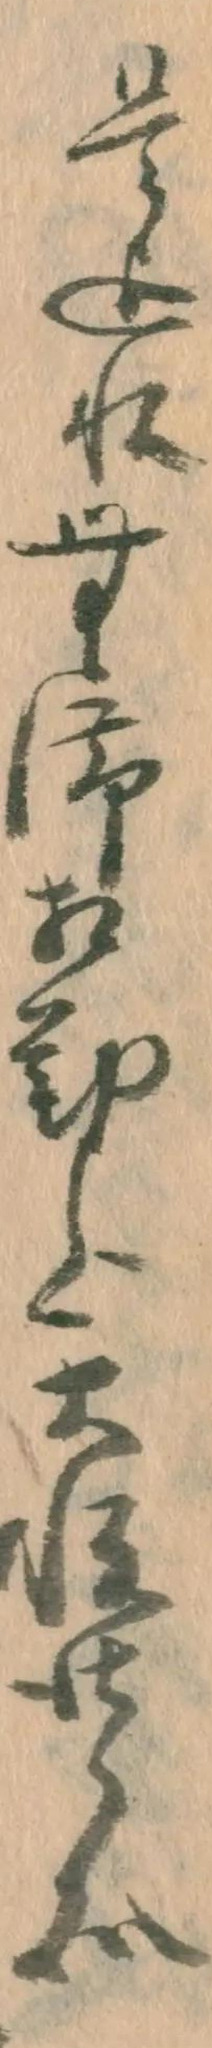是迄私無滞相勤上大悦仕候処
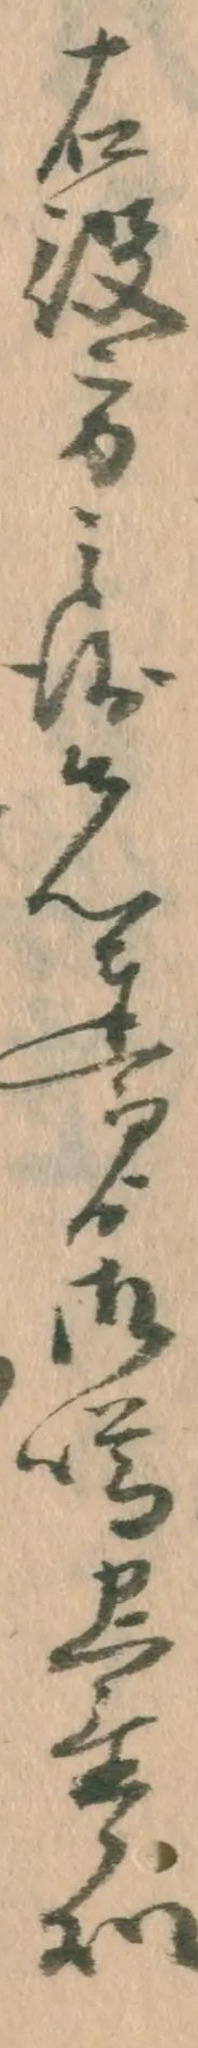右役方之儀先達而ゟ御噂申上置候処
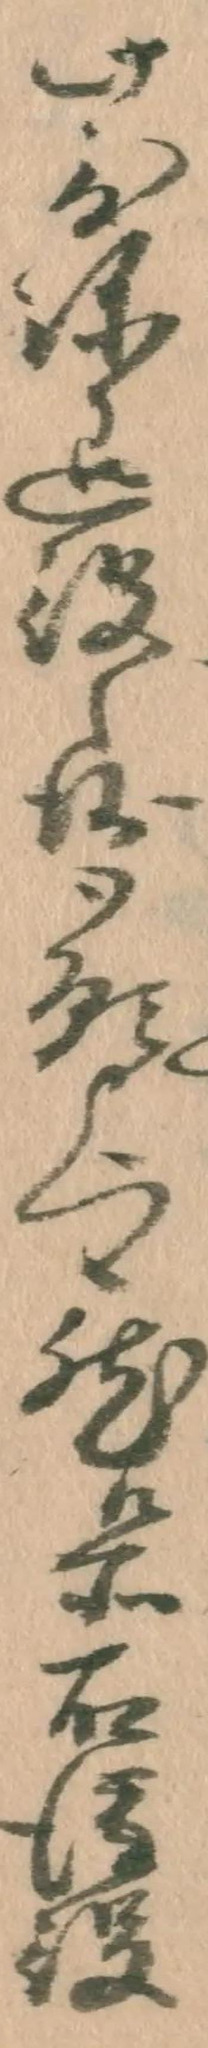此度弥退役之儀御願申上候然ル所右後役
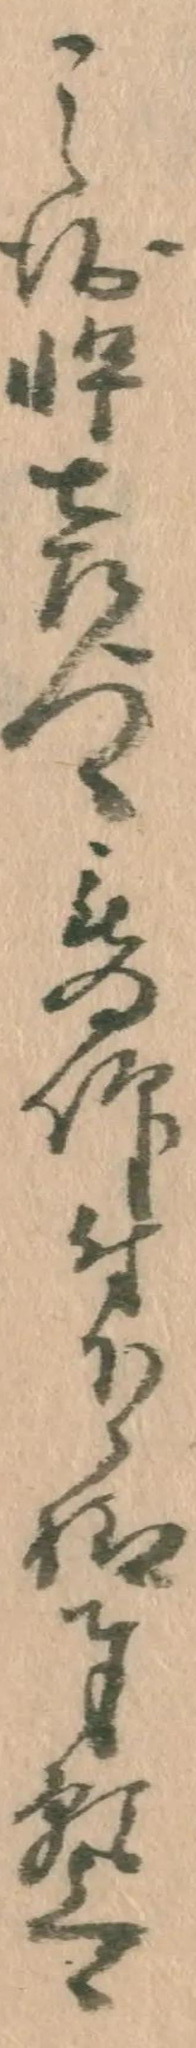之儀忰七左衛門へ被為仰付下候様奉願上候
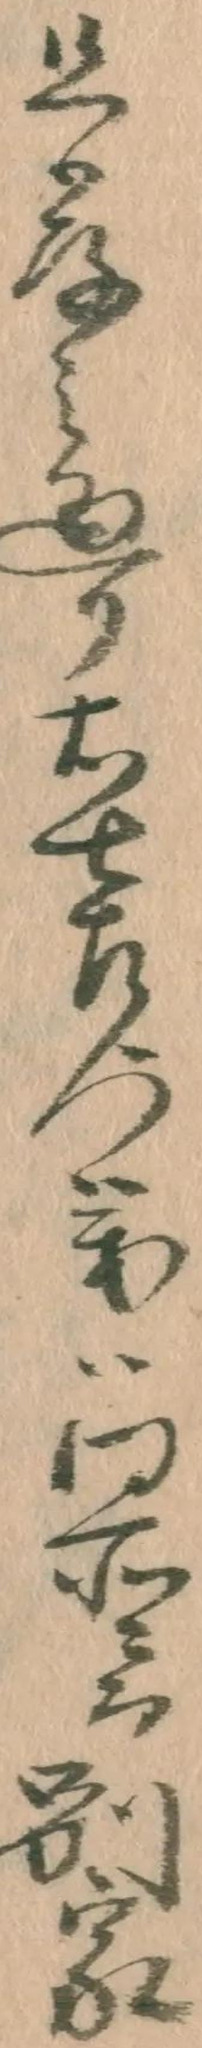且御存之通り右七左衛門義ハ同所ニ而別家
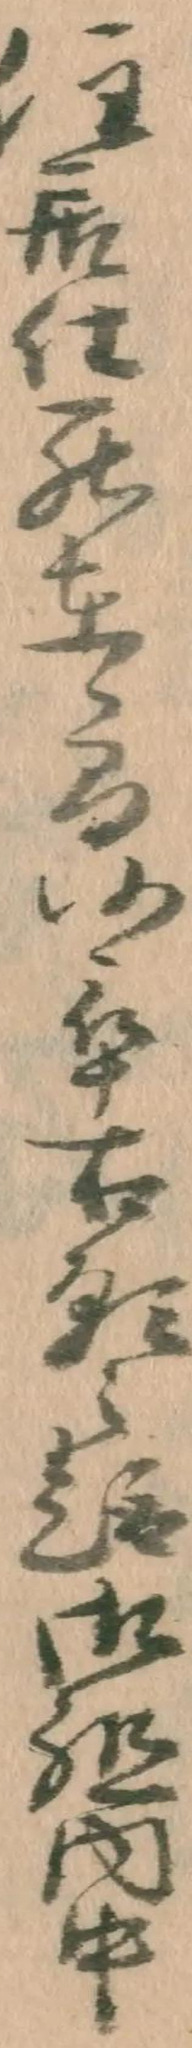住居仕罷在候間何卒右願之趣御組内中
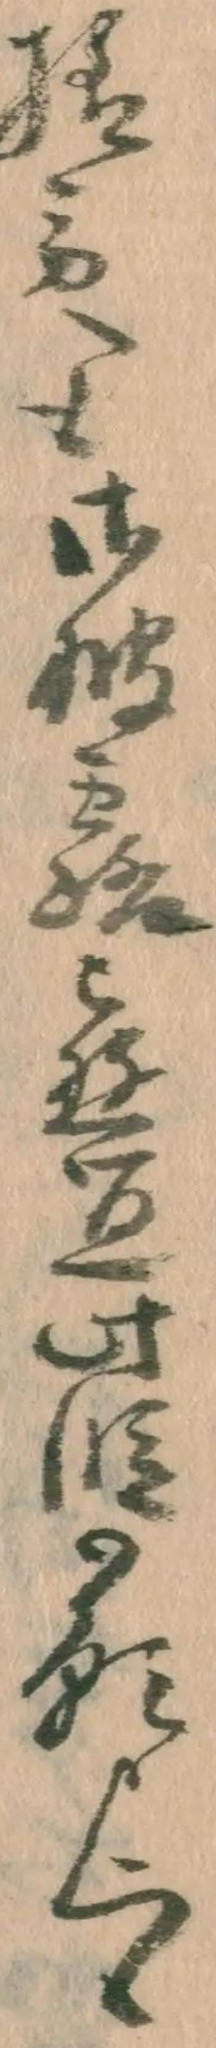様方へも御披覆被遊宜此段御願申上候
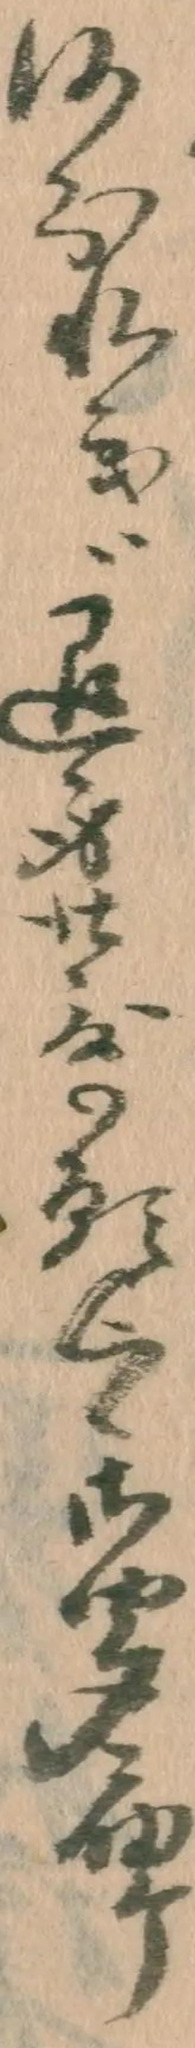何分私義ハ退身仕度御願上候御聞届ケ
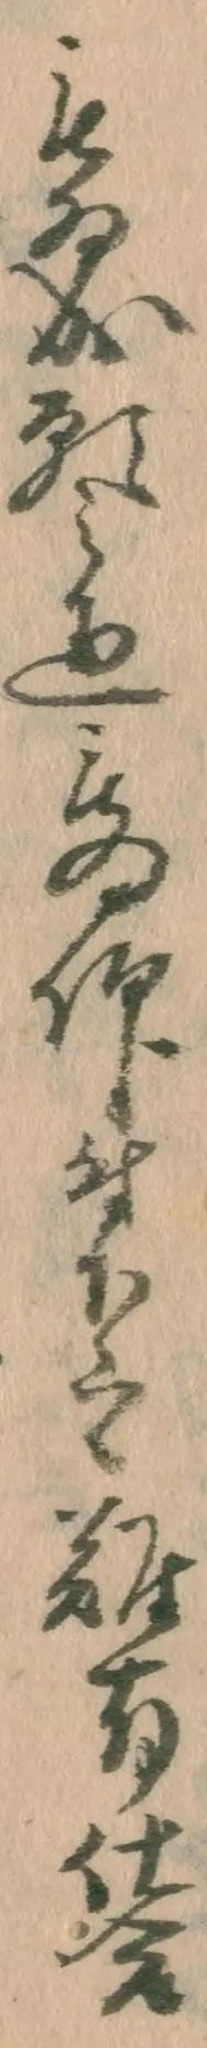被為成願之通被為仰付下候ハヽ難有仕合
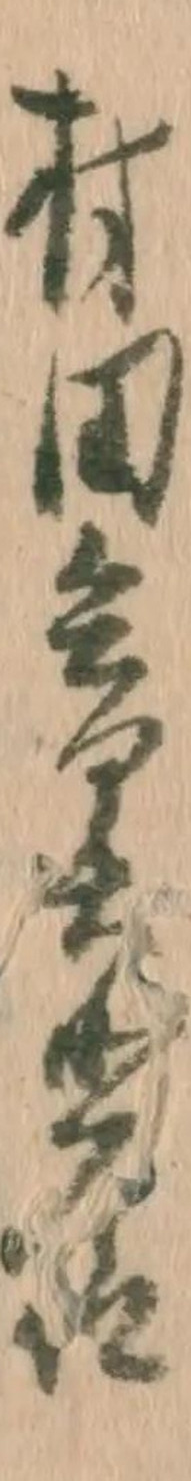村田兵部大丞様
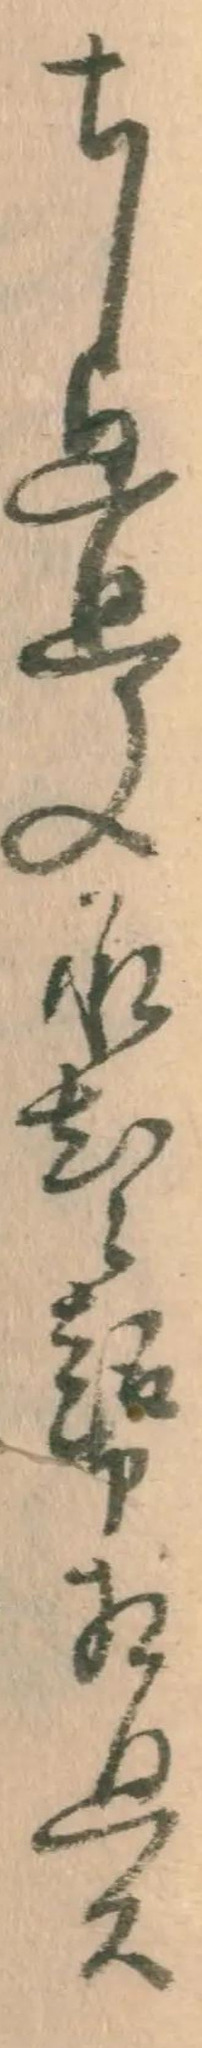右之通廻文承知之趣申相廻ス
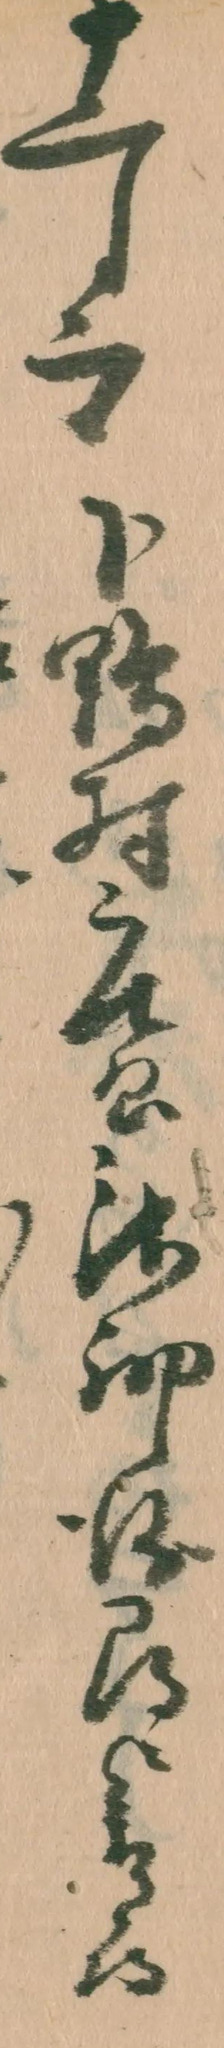十二月二日下鴨村庄屋銀納儀尋ニ参り候故
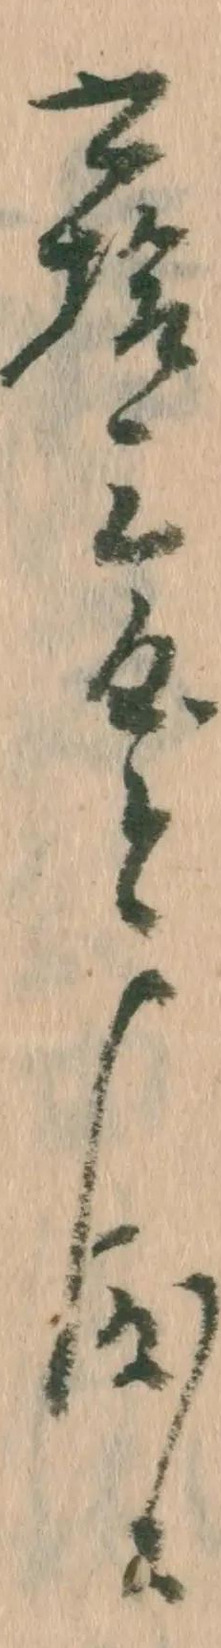六拾三匁と申渡候
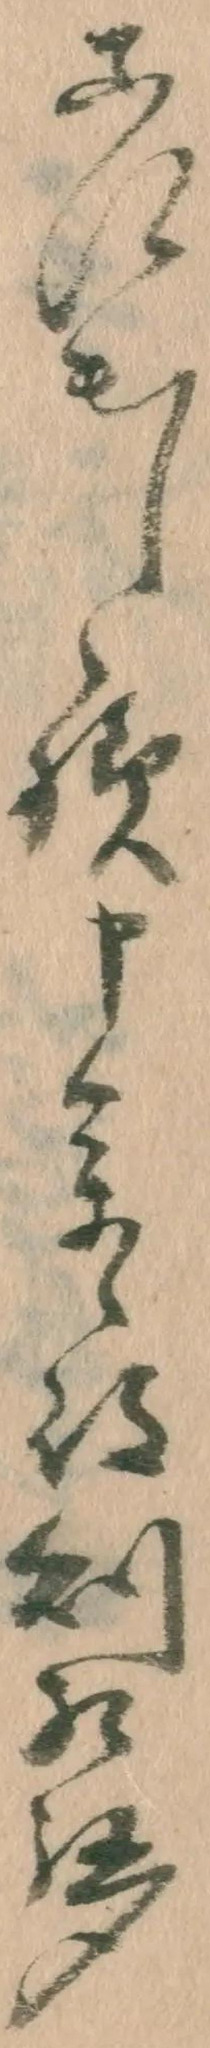差出し候様申参候故則相認メ
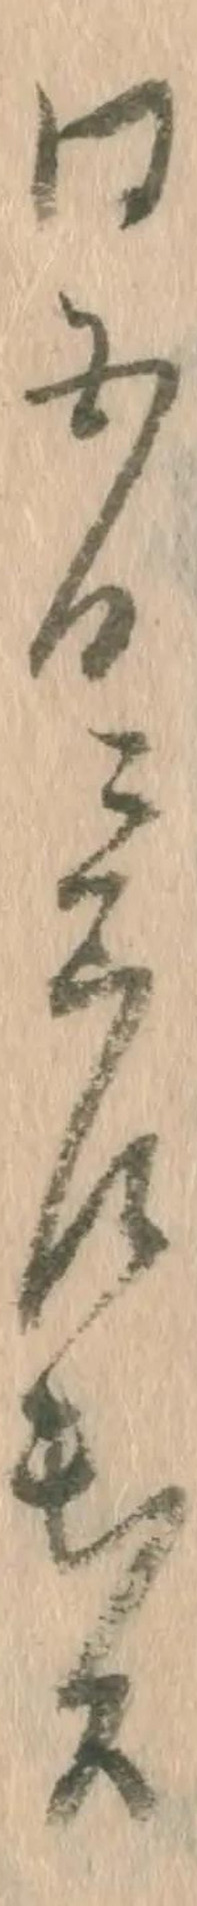同五日ニ差出ス
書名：賀茂社記録. 第61冊
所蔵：国立国会図書館 National Diet Library, JAPAN
